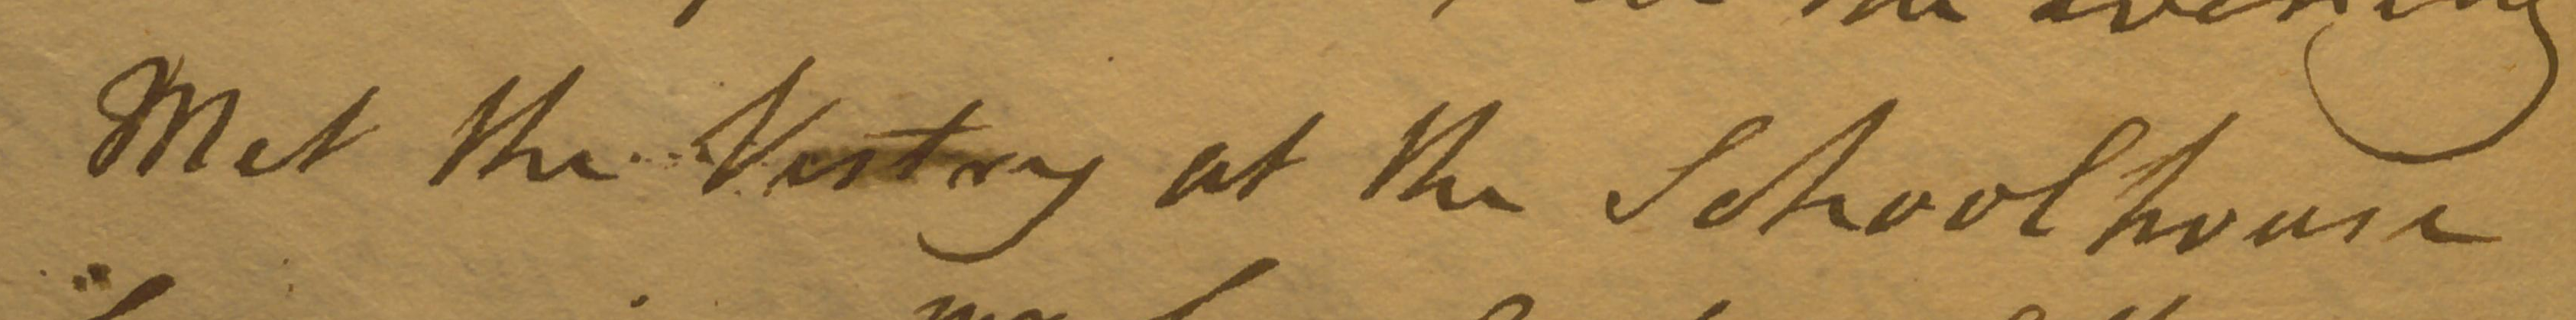Met the Vestry at the Schoolhouse
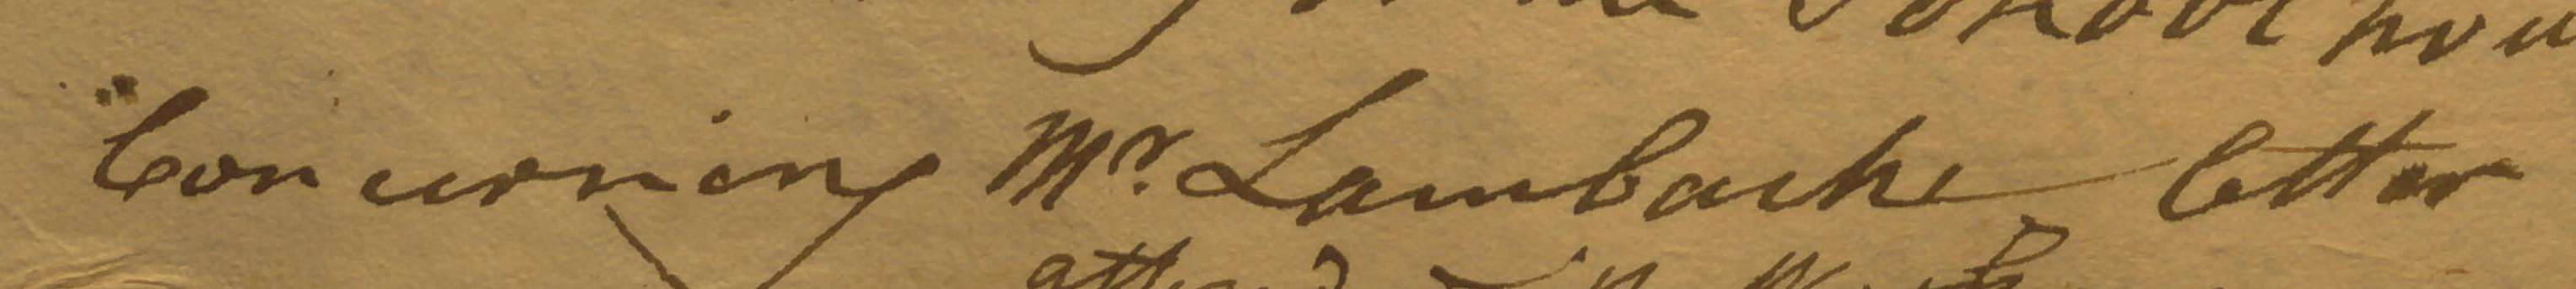Concerning M^r. Lambache letter
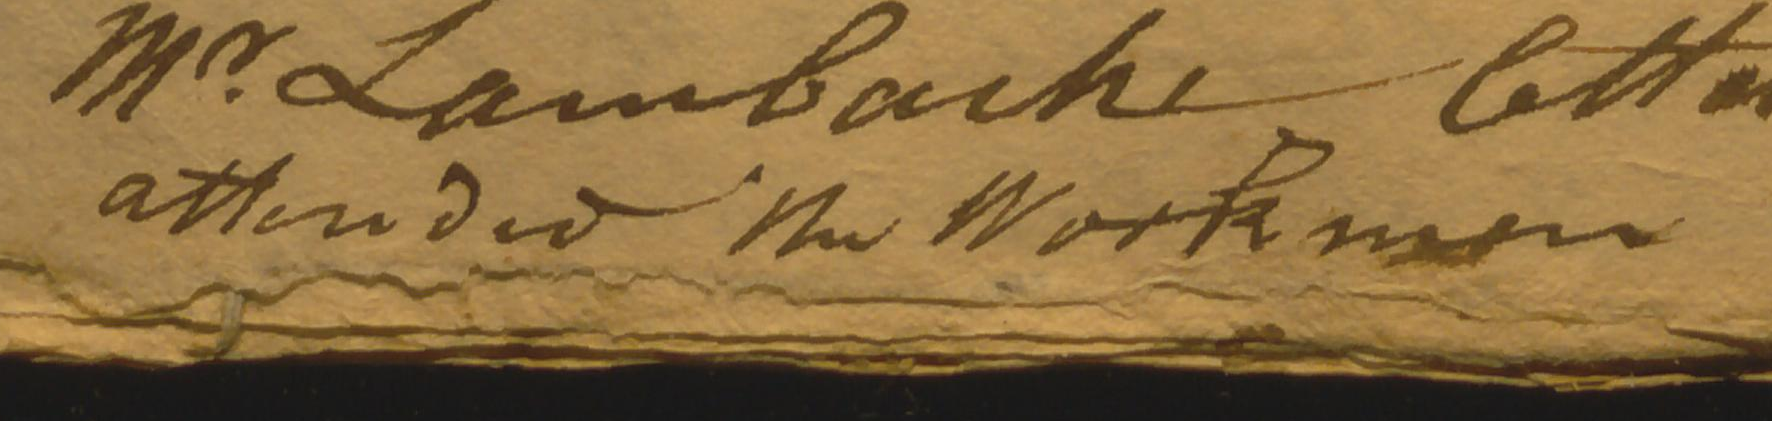attended the Workmen
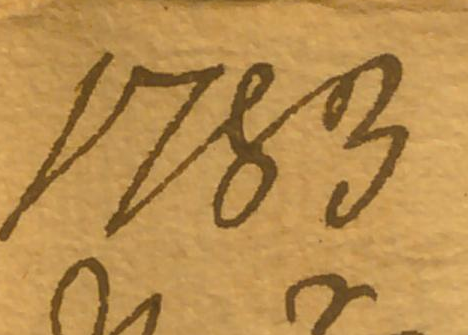1783
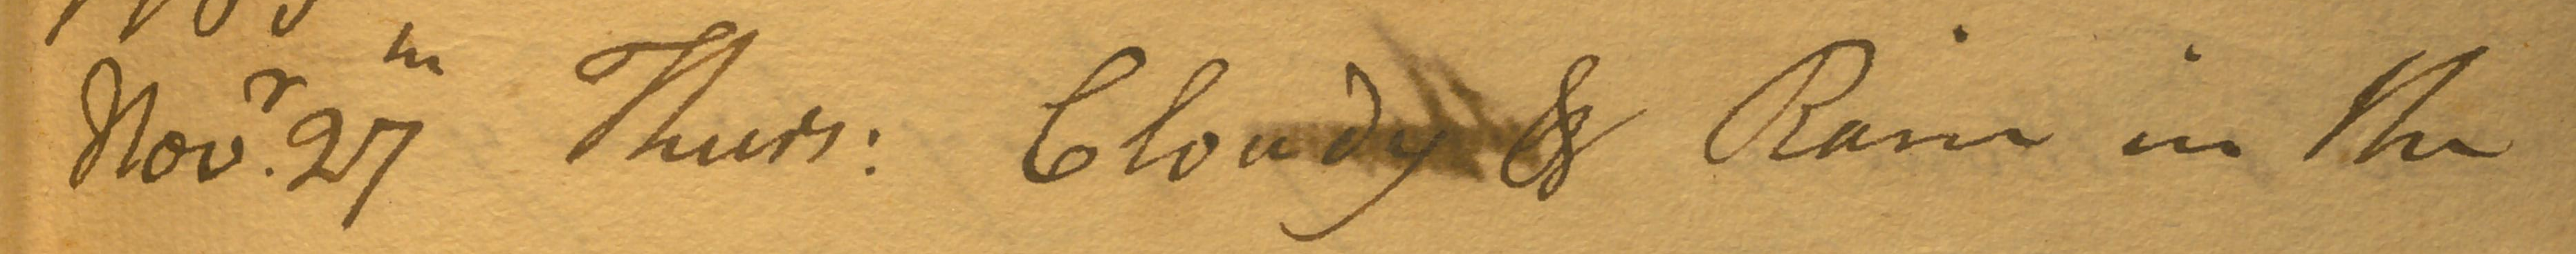Nov^r. 27^th Thurs: Cloudy l Ram in the
